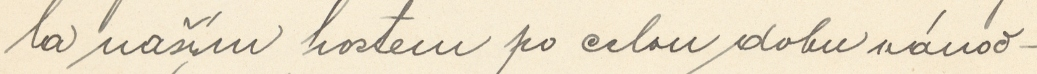la naším hostem po celou dobu vánoč-
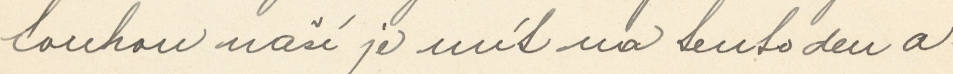touhou naší je mít na tento den a-
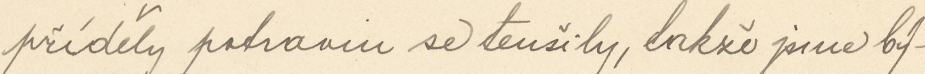příděly potravin se tenčily, takže jsme bý-
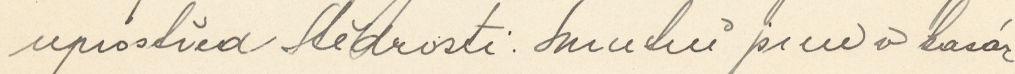uprostřed Štědrosti. Smutně jsme v kasár-
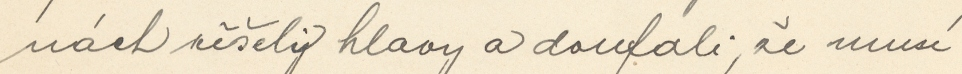nách věšeli hlavy a doufali, že musí
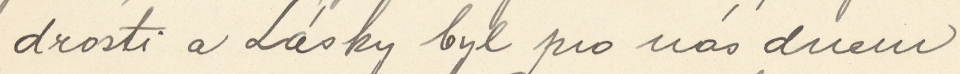drosti a Lásky byl pro nás dnem
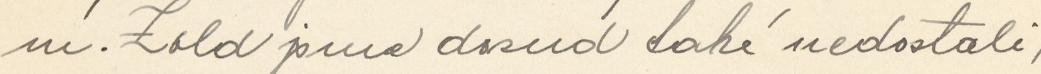ní. Žold jsme dosud také nedostali,
